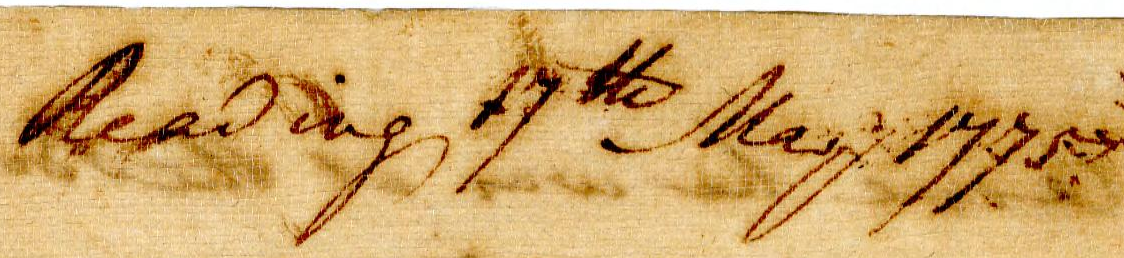Reading 7^th May 1775
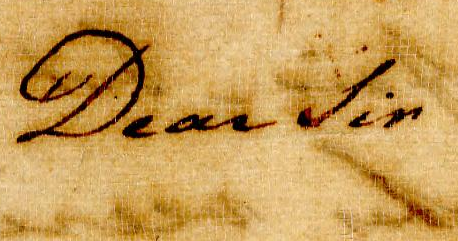Dear Sir
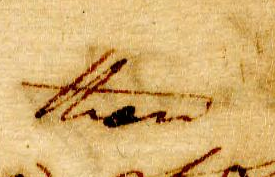than
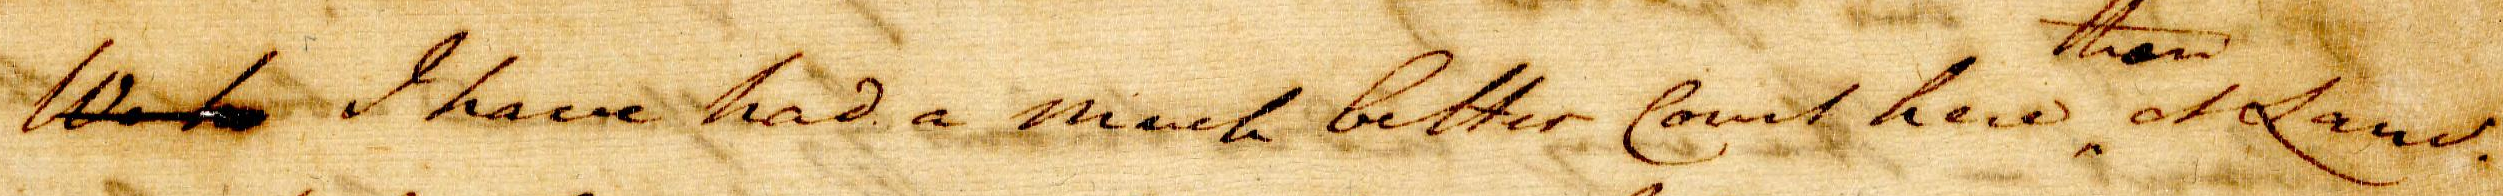[We h] I have had a much better Court here ^ at Land.
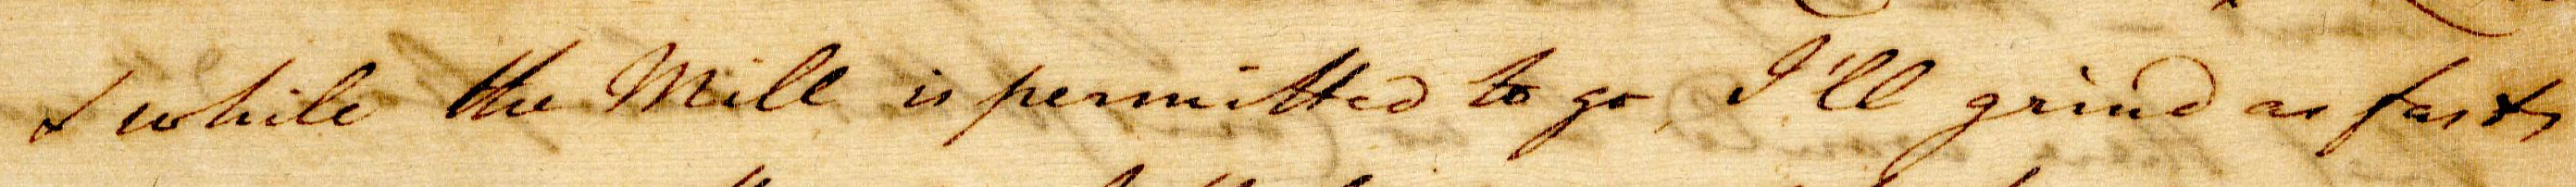& while the Mill is permitted to go, I'll grind as fast
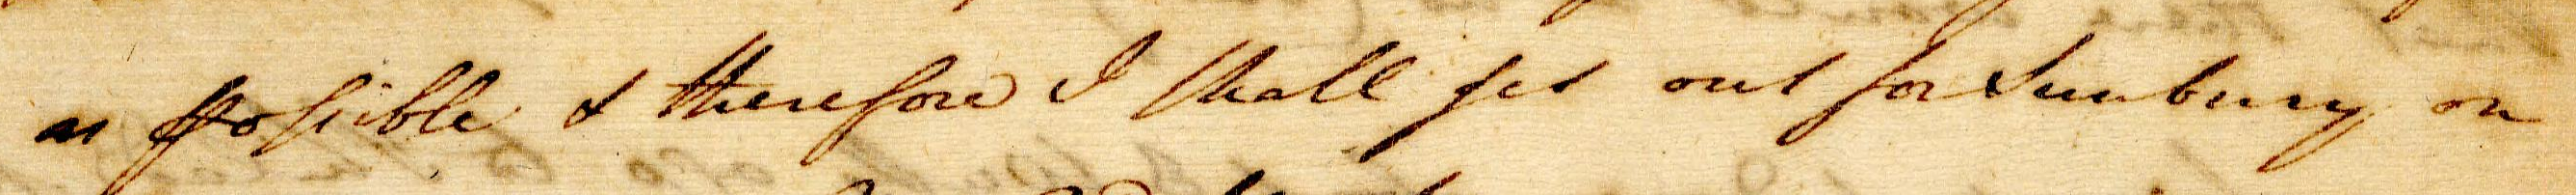as possible & therefore I shall get out for Sunbury on
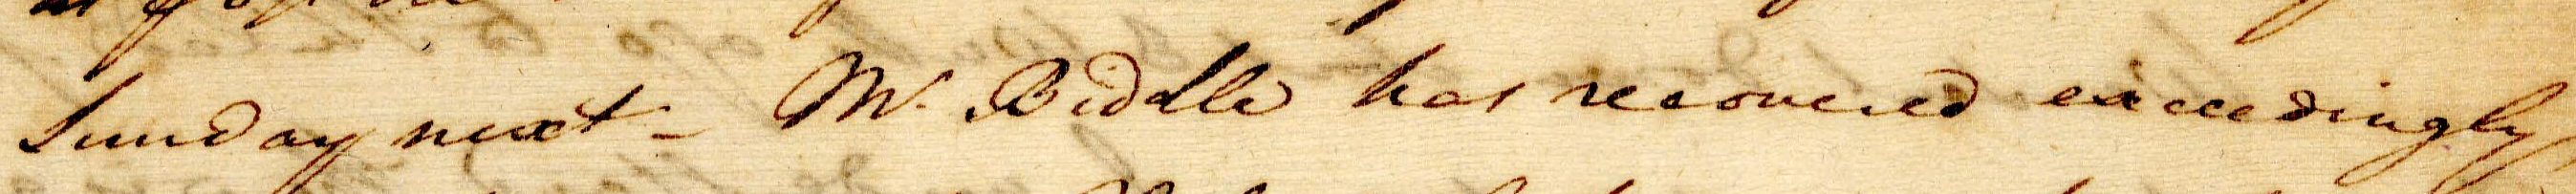Sunday next. M^r. Riddle has recovered exceedingly
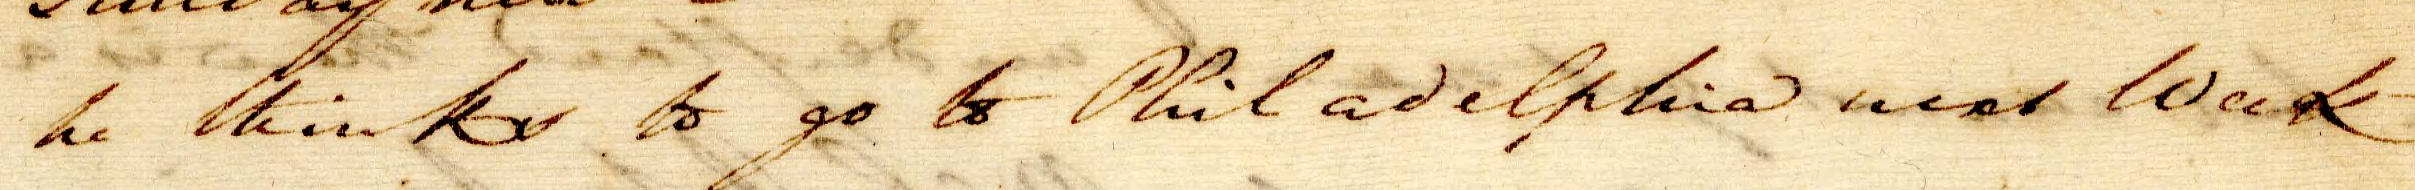he thinks to go to Philadelplia next Week
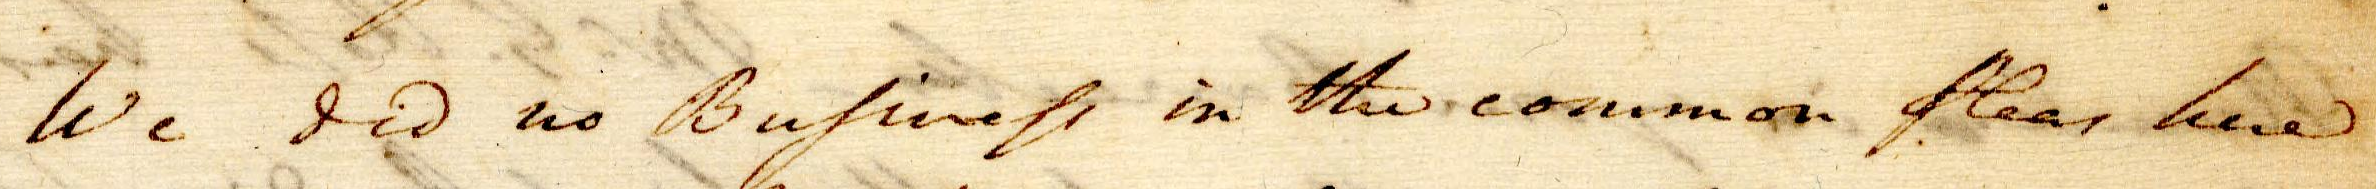We did no Business in the common Pleas here
